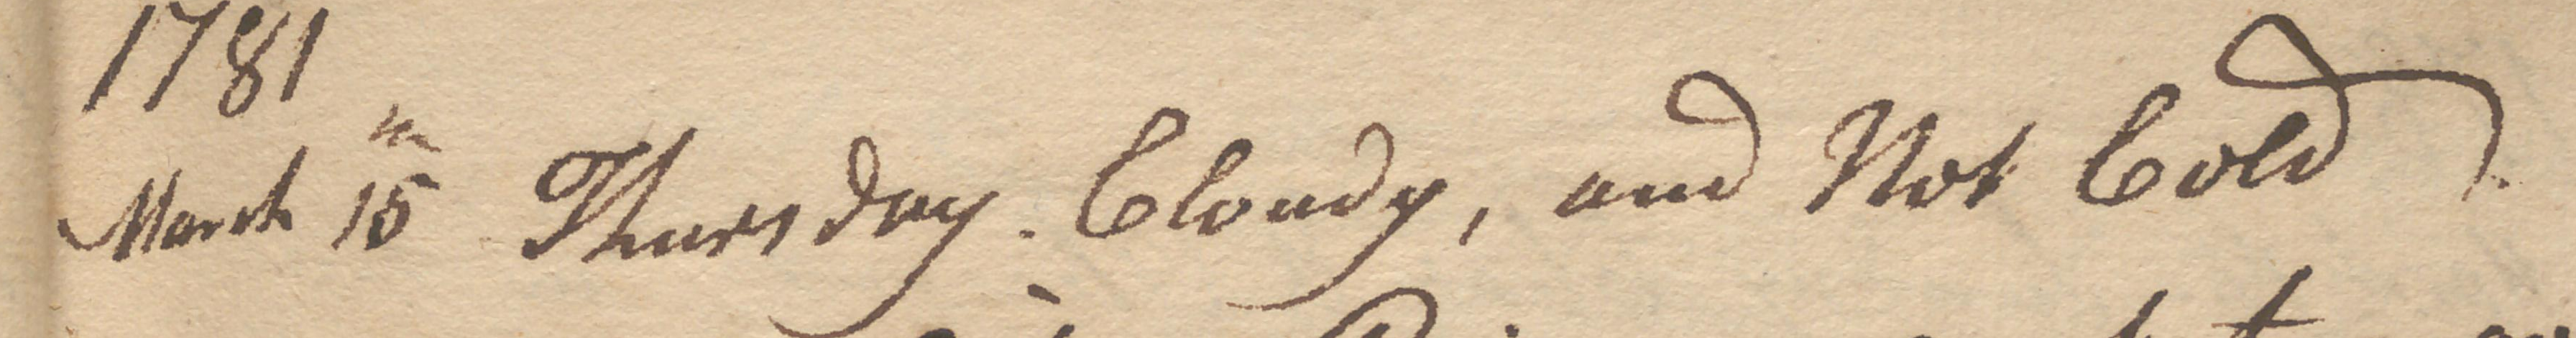March 15^th Thurs day. Cloudy, and Not Cold
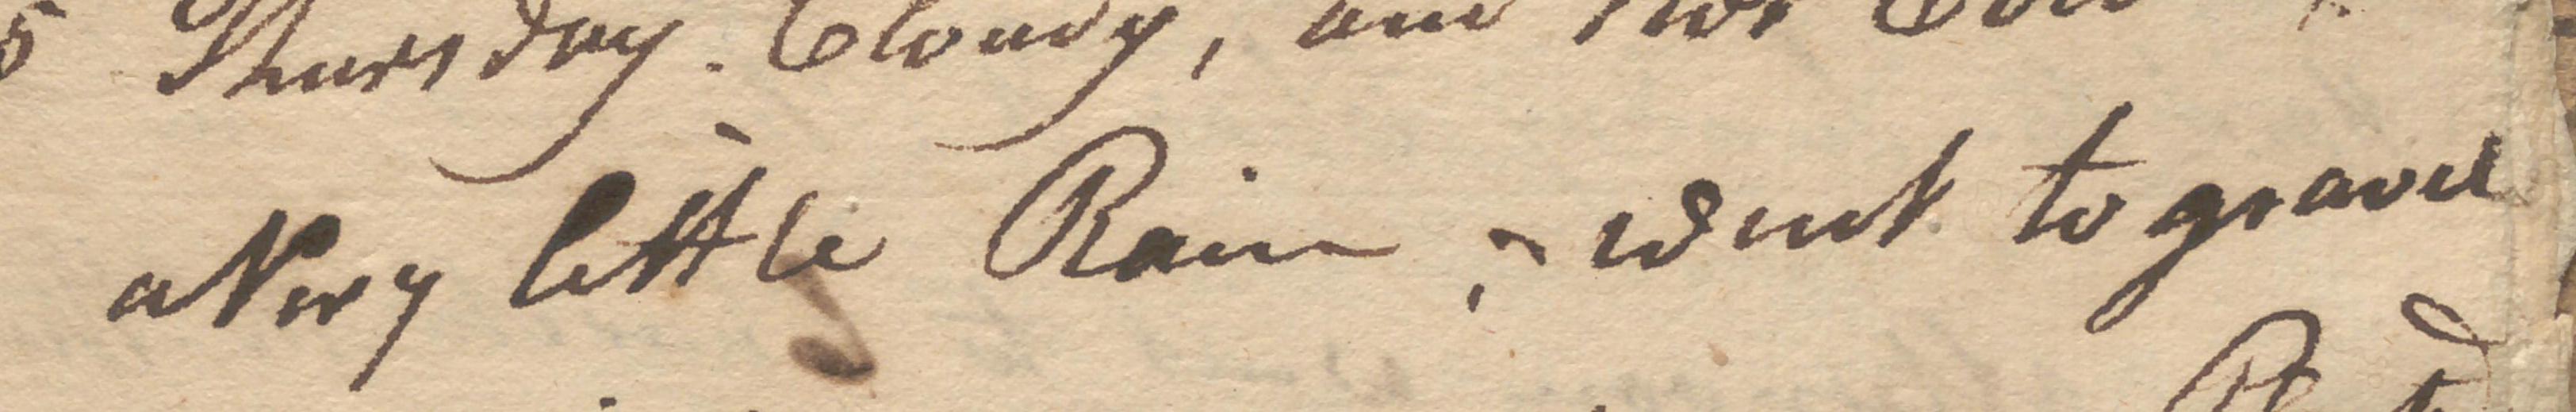a Very little Rain- went to gravel
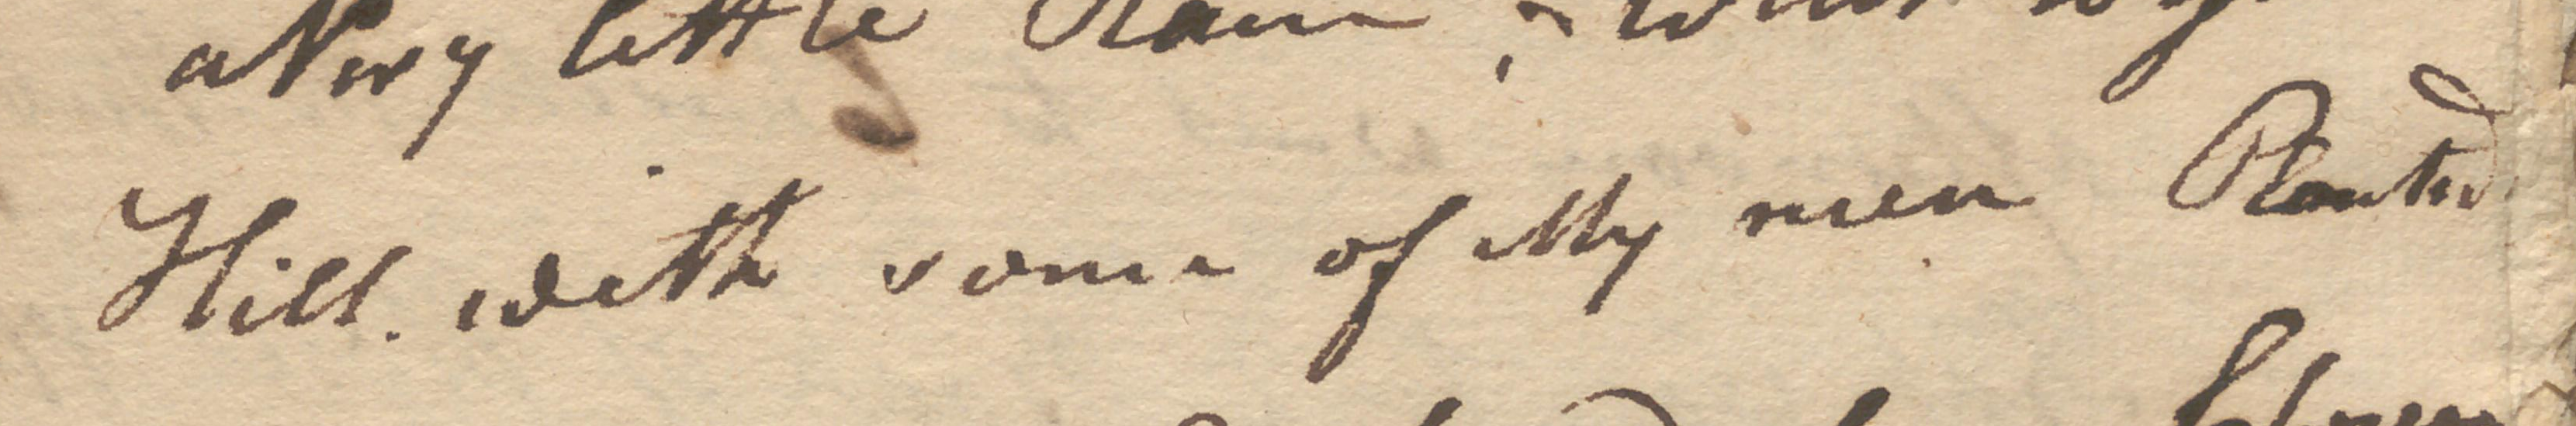Hill with some of My men Planted
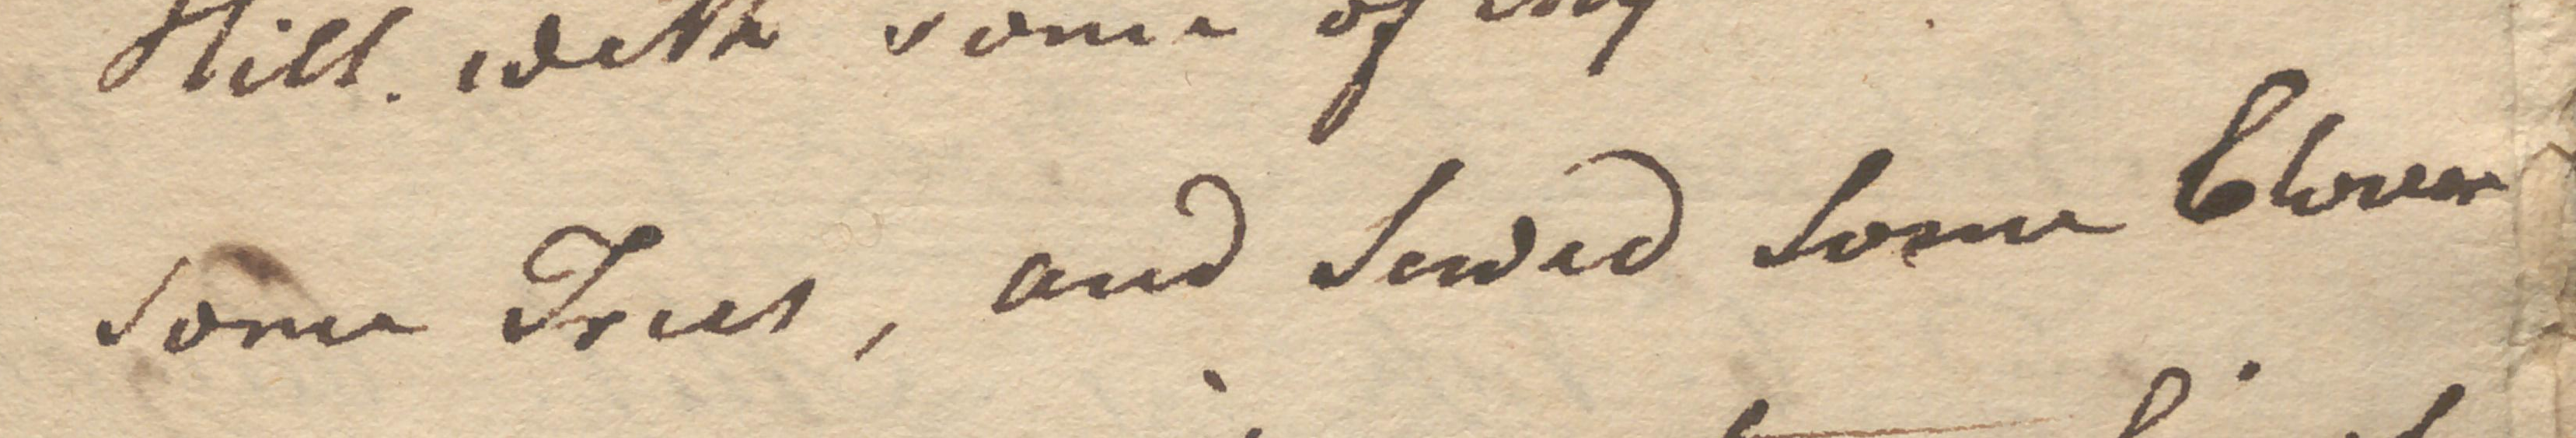some Trees, and sewed some Clover
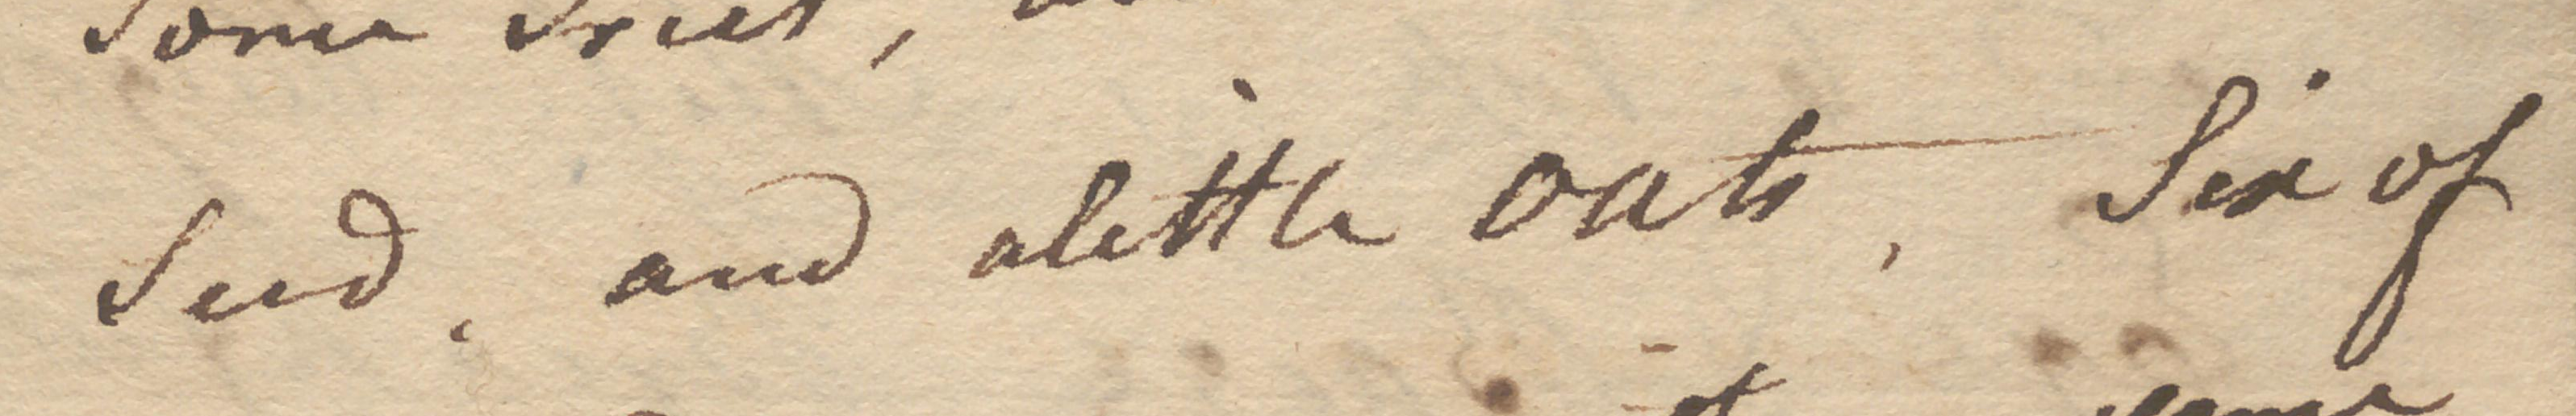seed, and a little oats Six of
